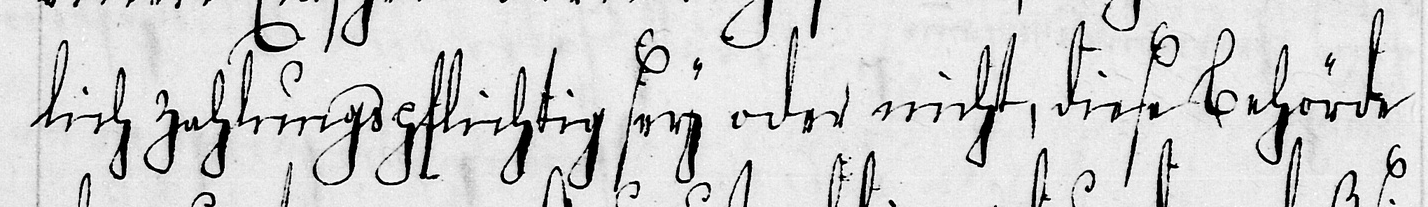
lich zahlungspflichtig sey oder nicht, diese Behörde
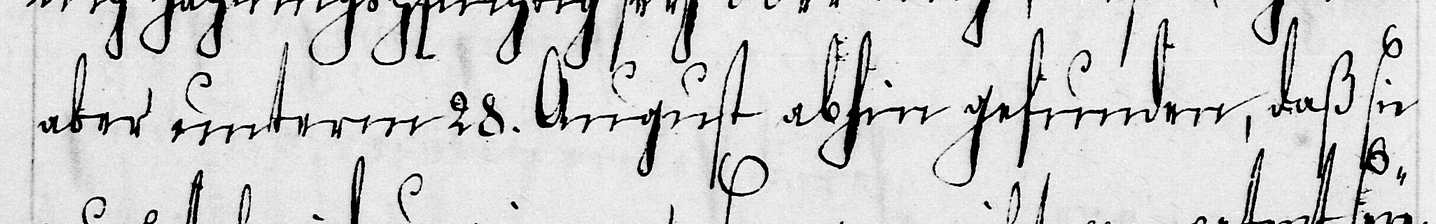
aber unterm 28. August abhin gefunden, daß sie
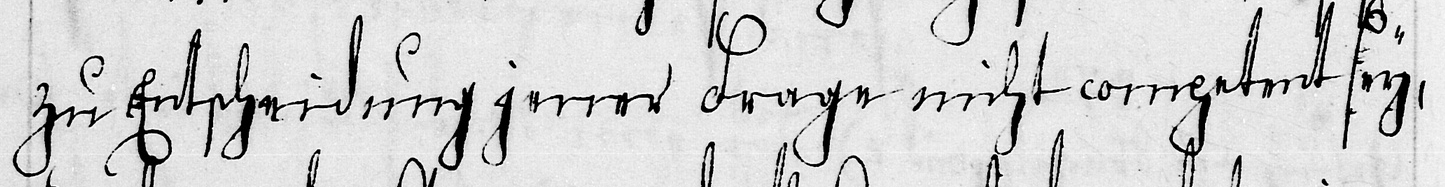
zu Entscheidung jener Frage nicht competent sey,
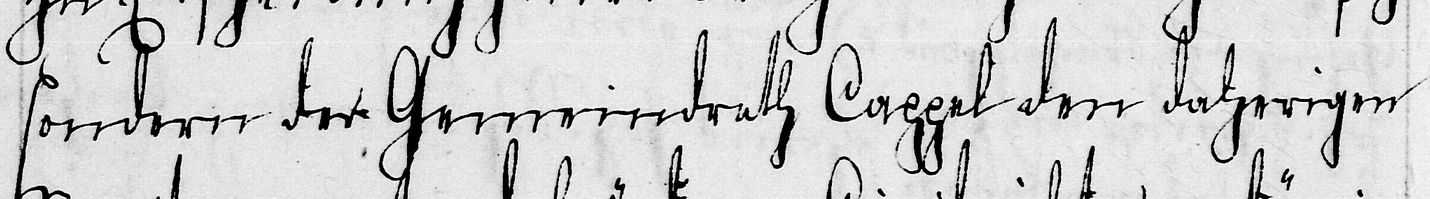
sondern der Gemeindrath Cappel den daherigen
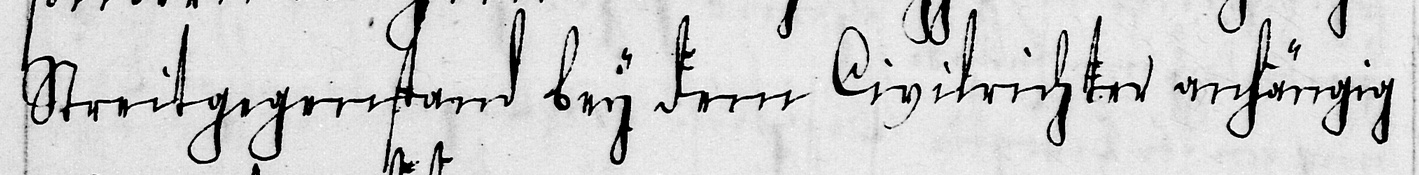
Streitgegenstand bey dem Civilrichter anhängig
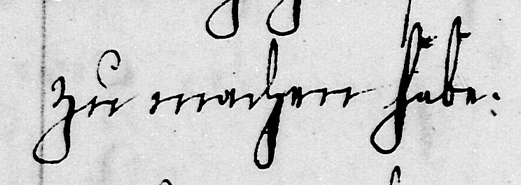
zu machen habe.
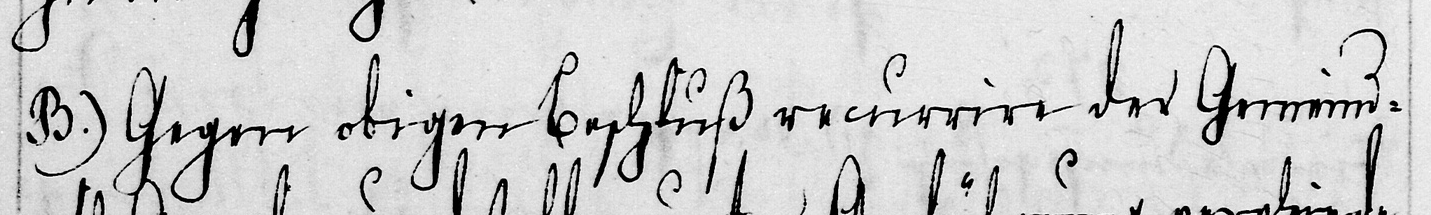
B.) Gegen obigen Beschluß recurrire der Gemeind¬
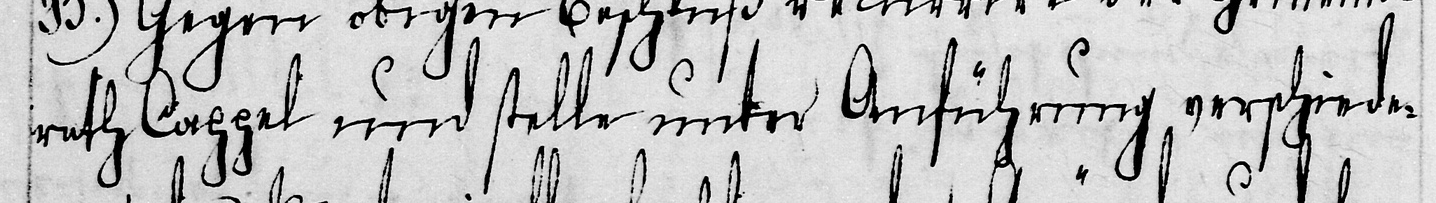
rath Cappel und stelle unter Anführung verschiede¬
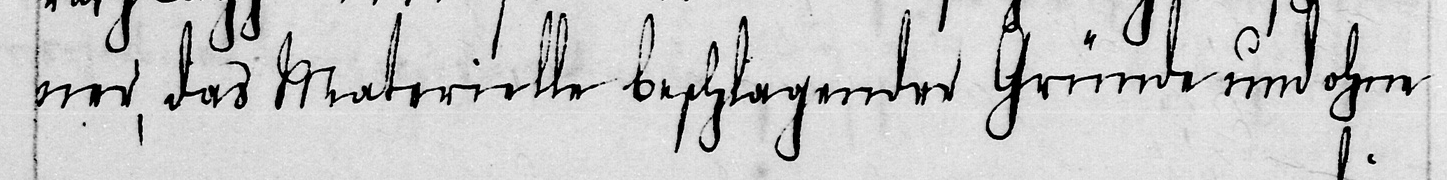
ner, das Materielle beschlagender Gründe und ohne
